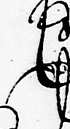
2.
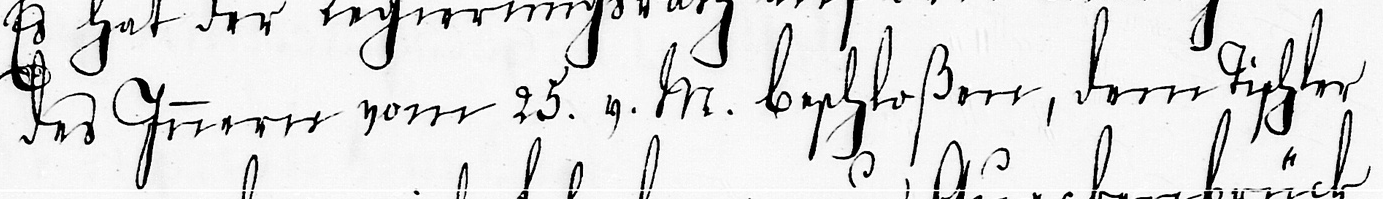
des Innern vom 25. v. M. beschloßen, dem Tischler
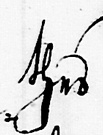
thes
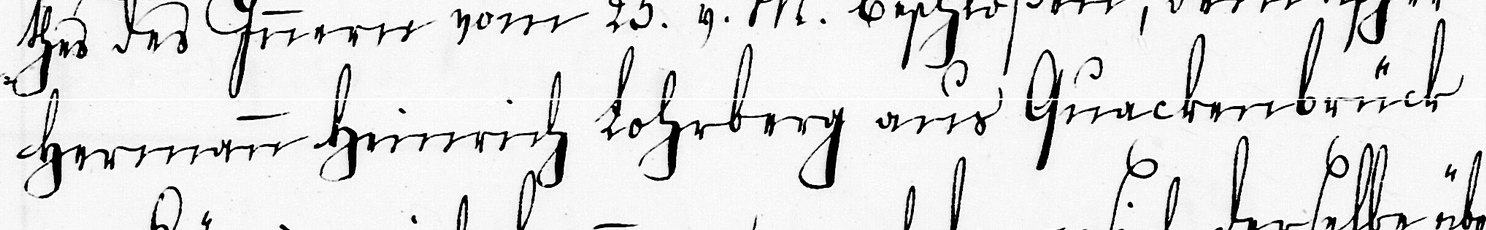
Hermann Heinrich Lohrberg aus Quackenbrück
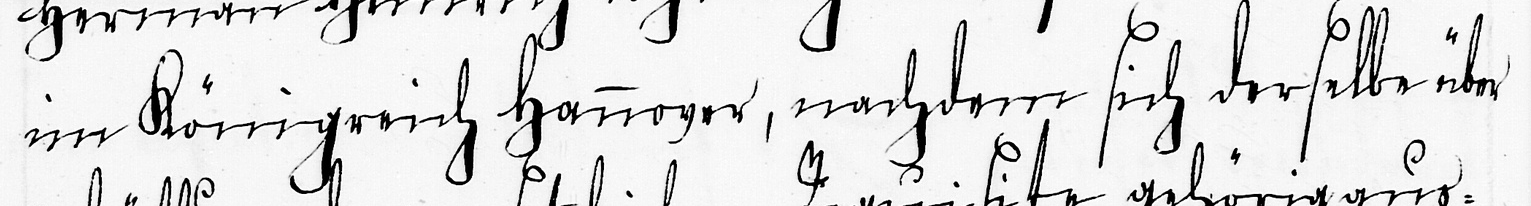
im Königreich Hannover, nachdem sich derselbe über
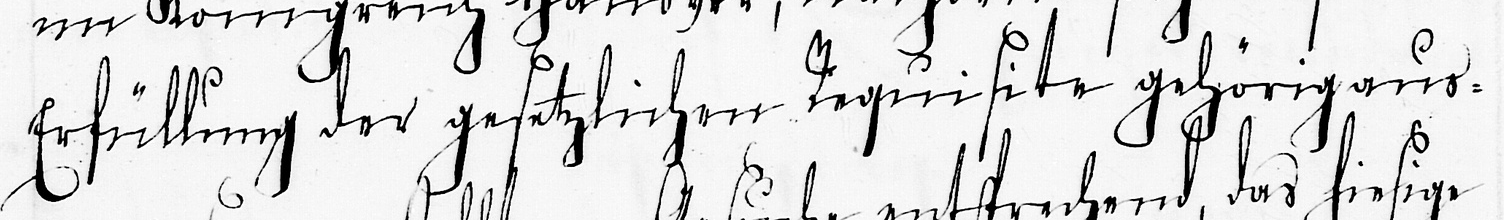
Erfüllung der gesetzlichen Requisite gehörig aus¬
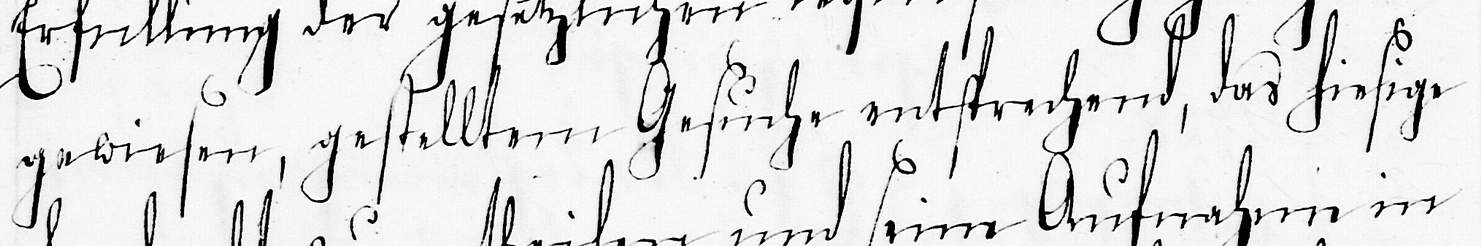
gewiesen, gestelltem Gesuche entsprechend, das hiesige
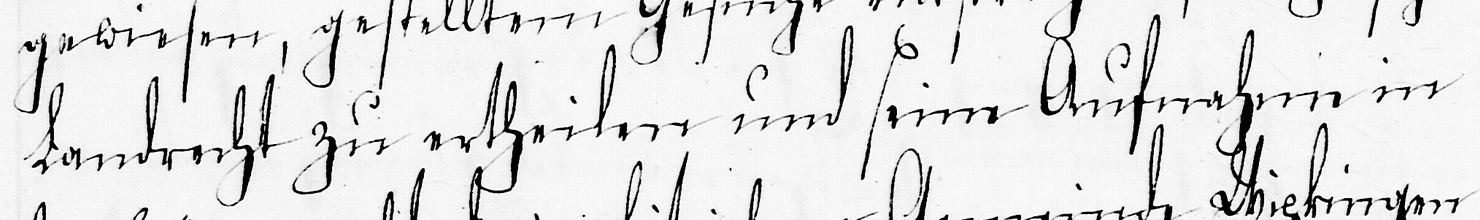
Landrecht zu ertheilen und seine Aufnahme in
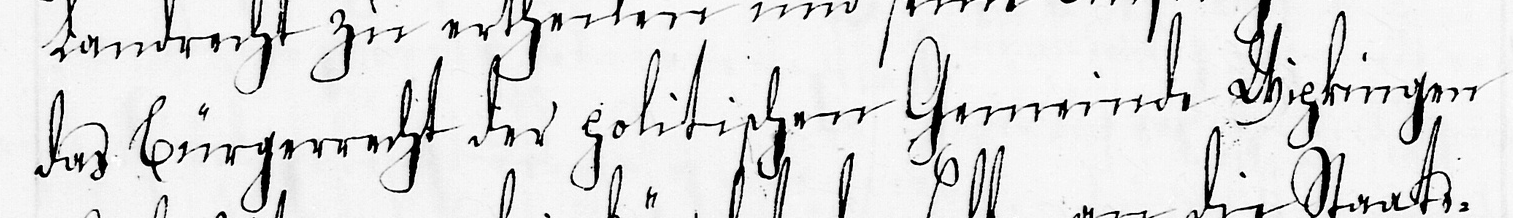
das Bürgerrecht der politischen Gemeinde Wipkingen
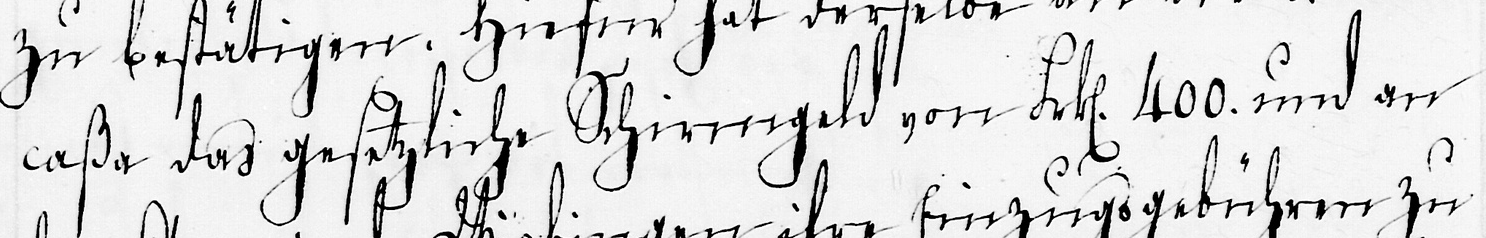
caßa das gesetzliche Schirmgeld von Frk[en]. 400. und
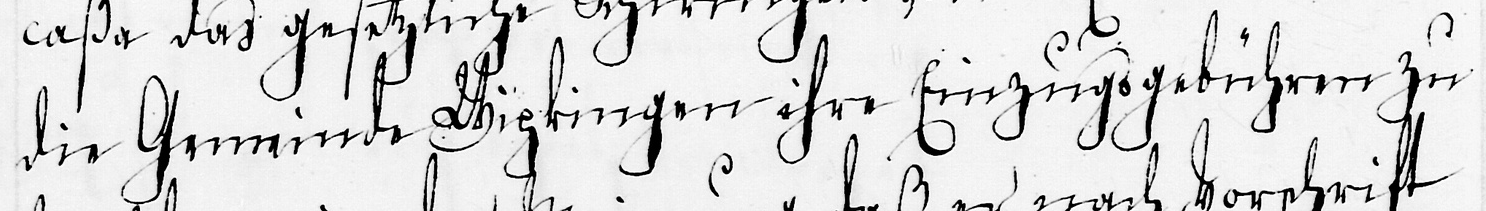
die Gemeinde Wipkingen ihre Einzugsgebühren zu
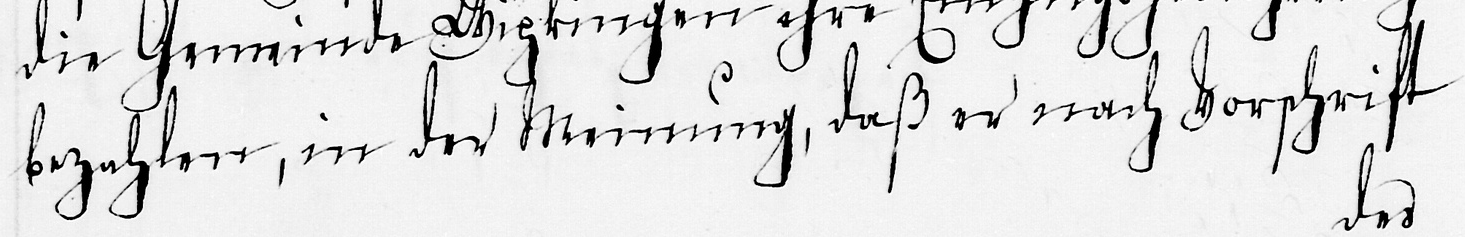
bezahlen, in der Meinung, daß er nach Vorschrift
